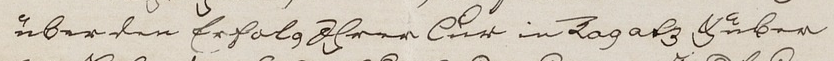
über den Erfolg Ihrer Cur in Ragatz & über
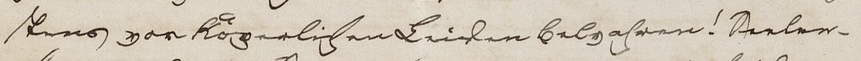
stens vor körperlichen Leiden bewahren! Seelen-
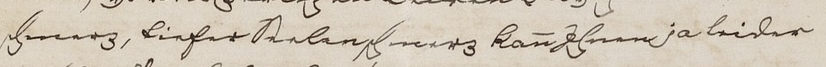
schmerz, tiefer Seelenschmerz kann Ihnen ja leider
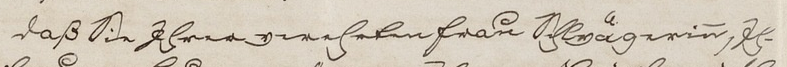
Daß Sie Ihrer verehrten Frau Schwägerinn, Ih-
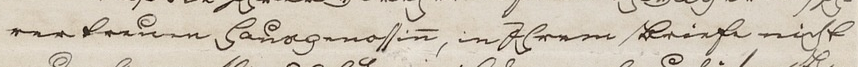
rer treuen Hausgenossinn, in Ihrem Briefe nicht
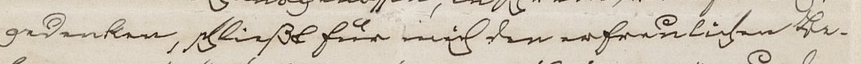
gedenken, schließt für mich den erfreulichen Be-
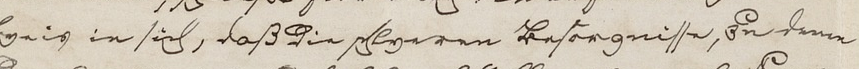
weis in sich, daß die schweren Besorgnisse, zu denen
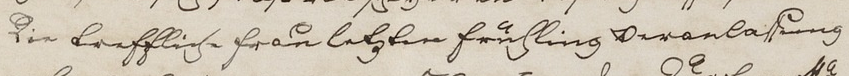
die treffliche Frau letzten Frühling Veranlassung
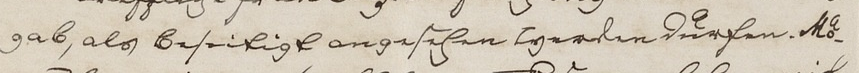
gab, als beseitigt angesehen werden dürfen. Mö-
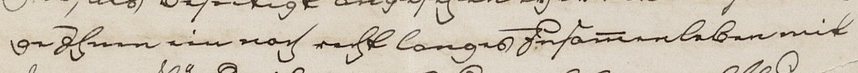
ge Ihnen ein noch recht langes Zusammenleben mit
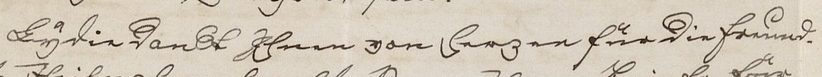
Lydie dankt Ihnen von Herzen für die freund-
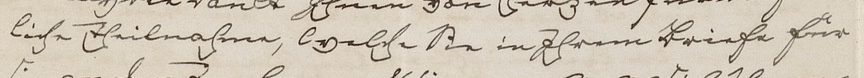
liche Theilnahme, welche Sie in Ihrem Briefe für
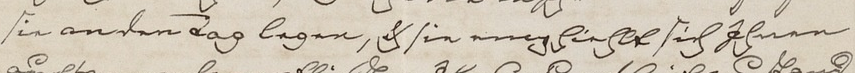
sie an den Tag legen, & Sie emphiehlt sich Ihnen
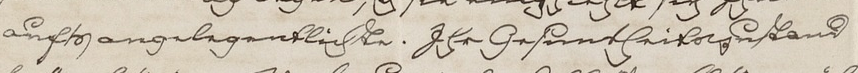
auf's angelegentlichste. Ihr Gesundheitszustand
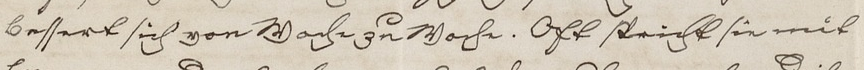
bessert sich von Woche zu Woche. Oft spricht sie mit
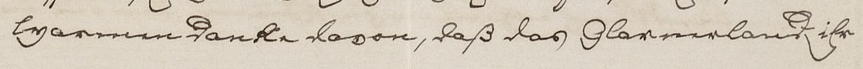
warmen Danke davon, daß das Glarnerland ihr
